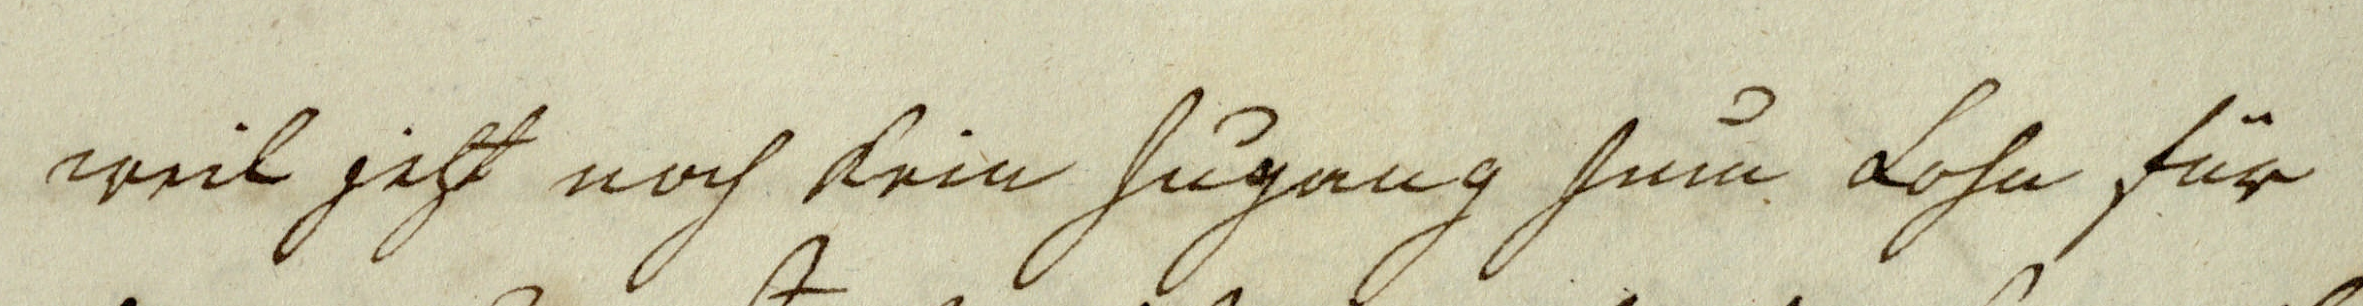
weil jetzt noch kein Zugang zum Lohn für
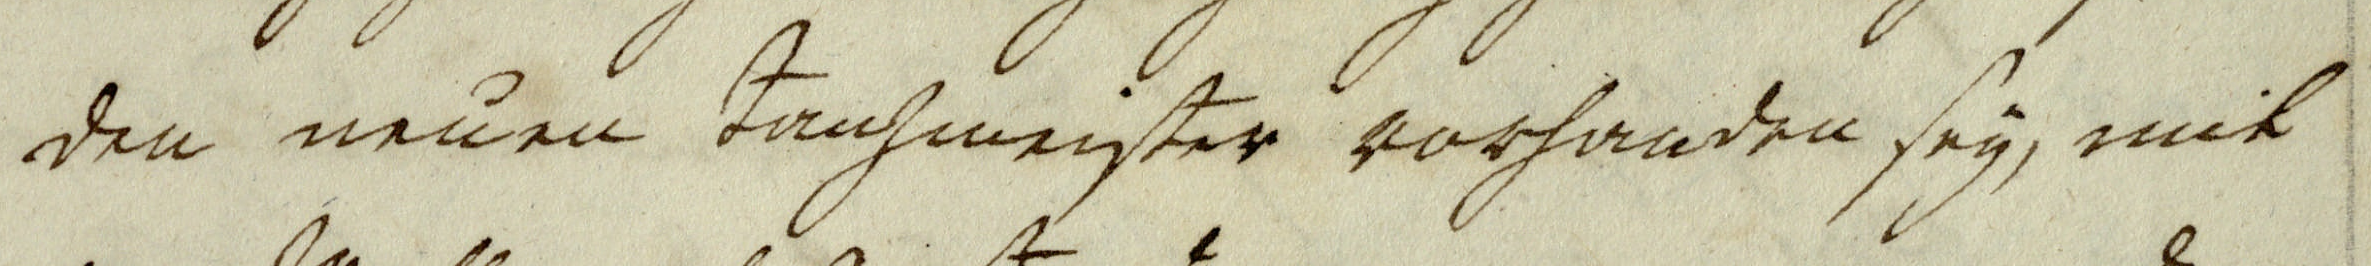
den neuen Tanzmeister vorhanden seÿ, mit
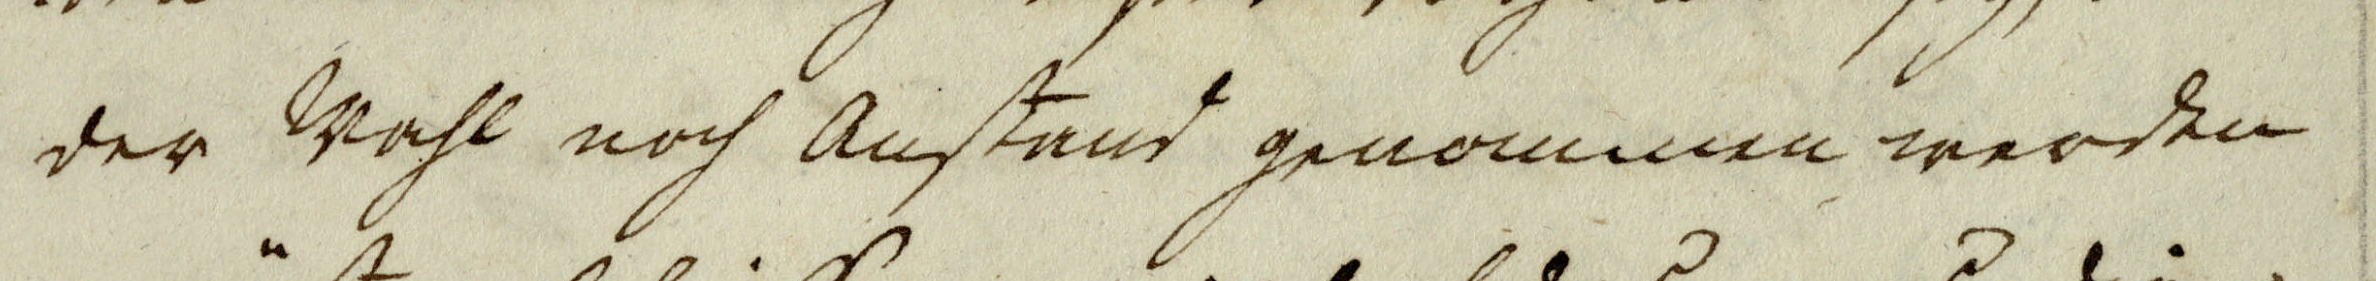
der Wahl noch Anstand genommen werden
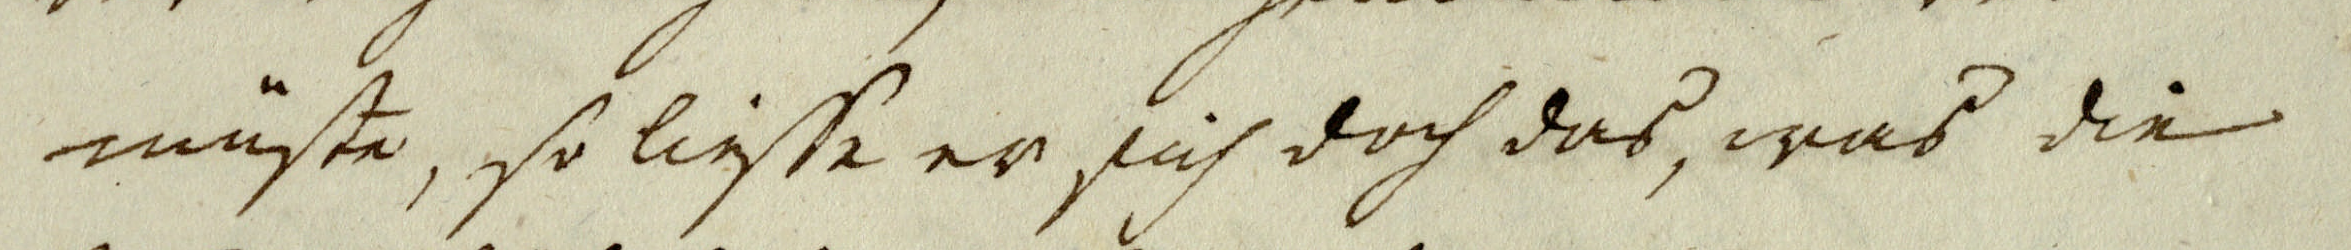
müßte, so liesse er sich doch das, was die
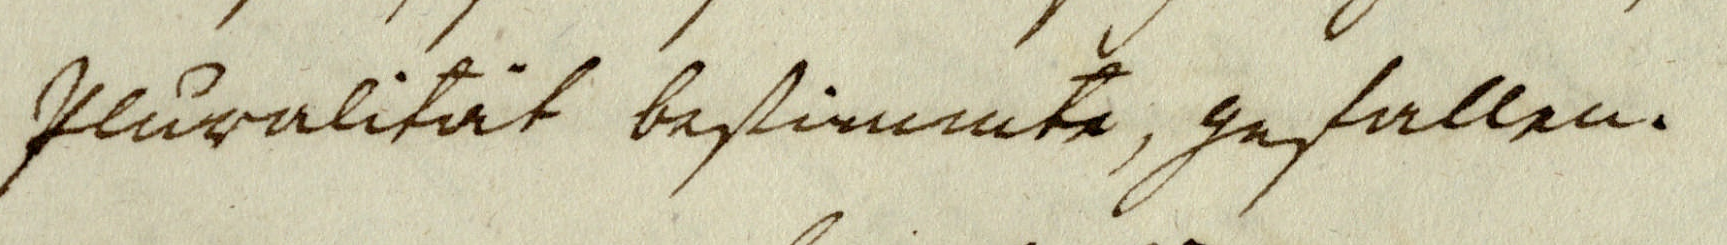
Pluralität bestimmte, gefallen.
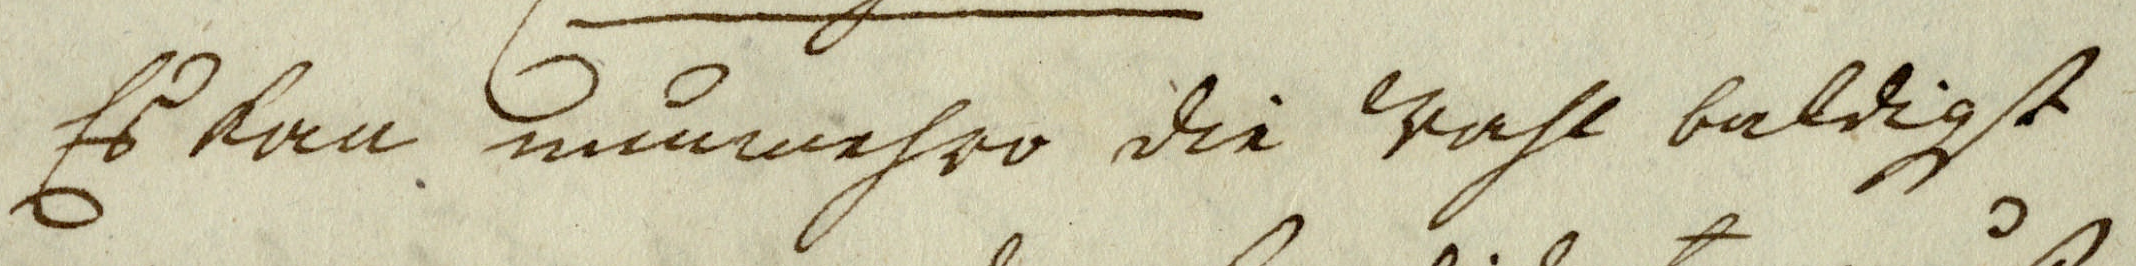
Es kan nunmehro die Wahl baldigst
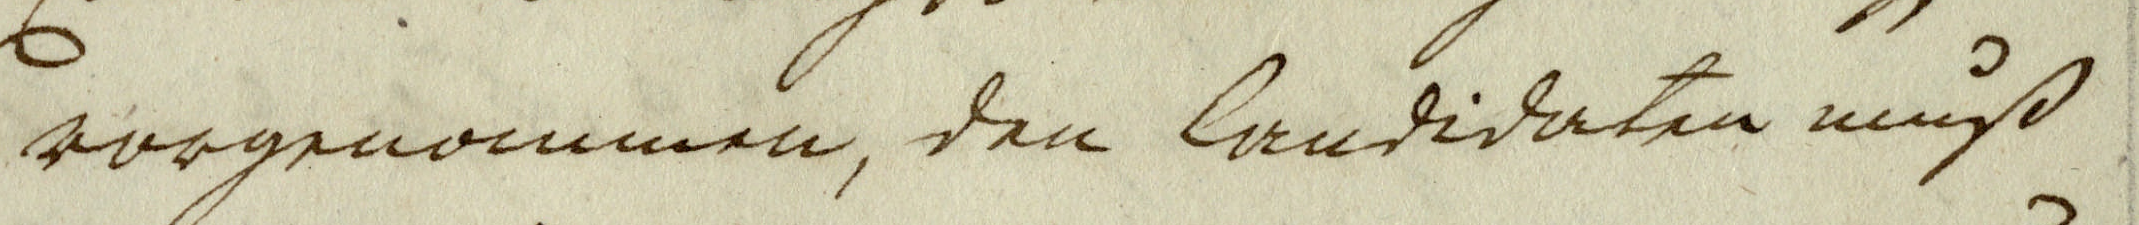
vorgenommen, den Candidaten muß
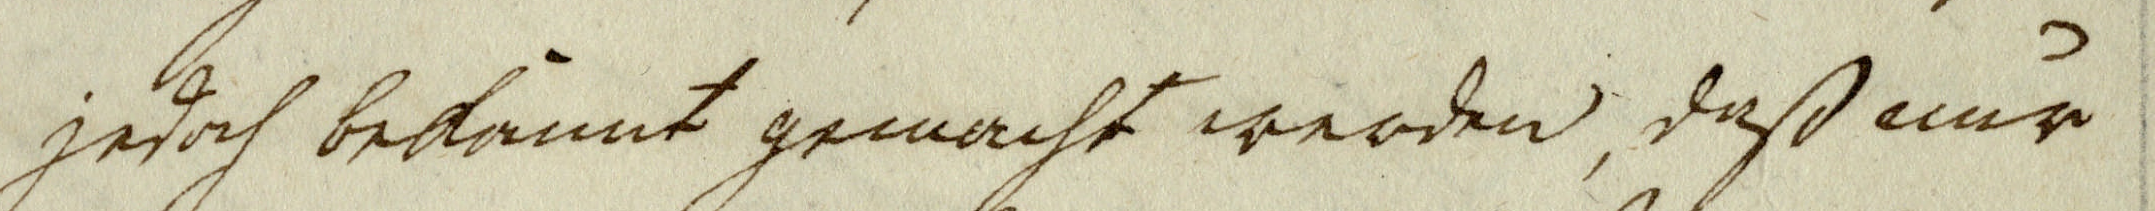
jedoch bekannt gemacht werden, daß nur
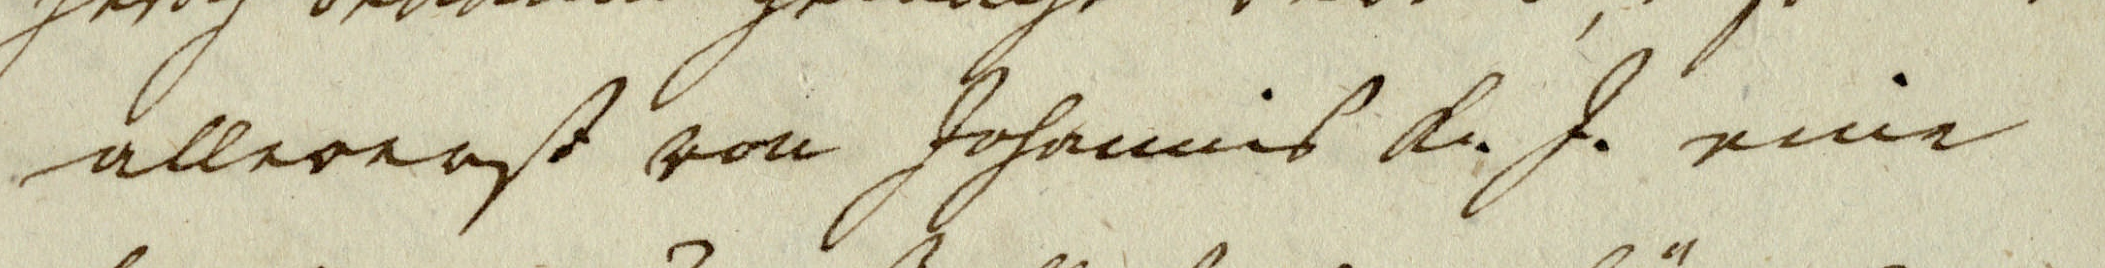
allererst von Johannis k. J. eine
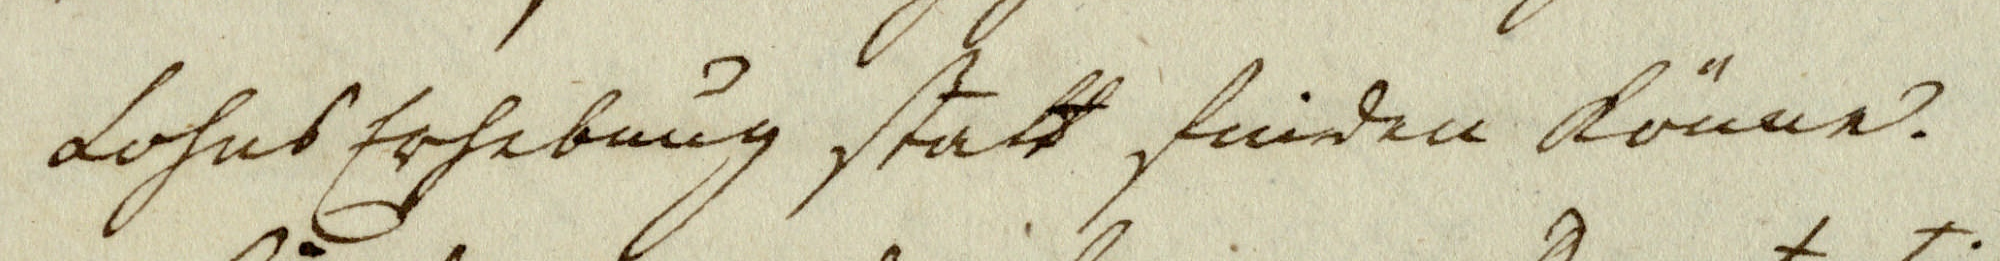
Lohns Erhebung statt finden könne.
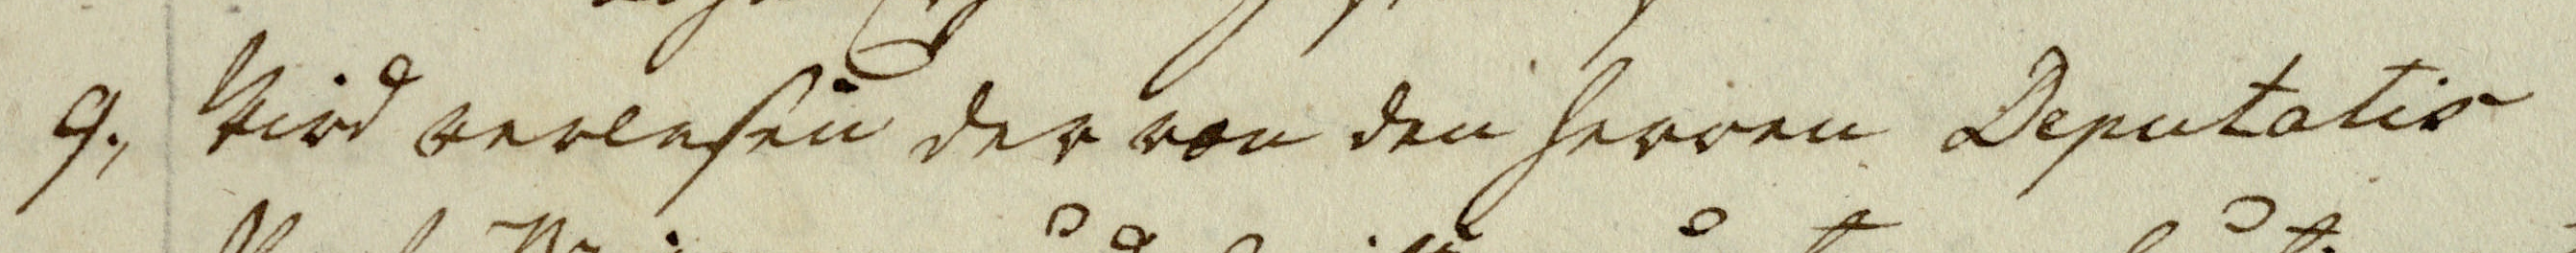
9. Wird verlesen der von dem Herren Deputatis
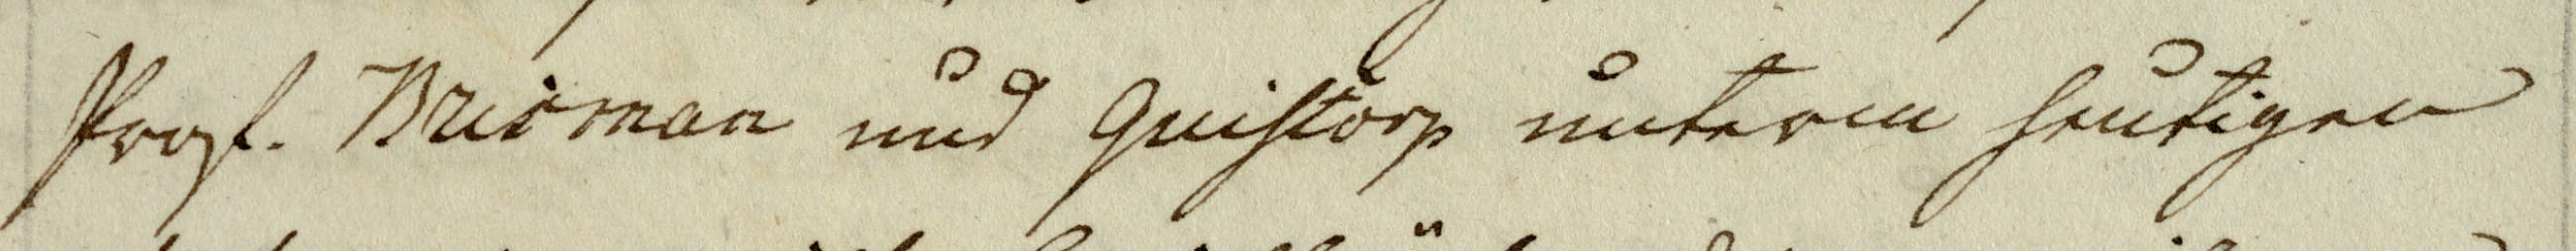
Prof. Brisman und Quistorp unterm heutigen
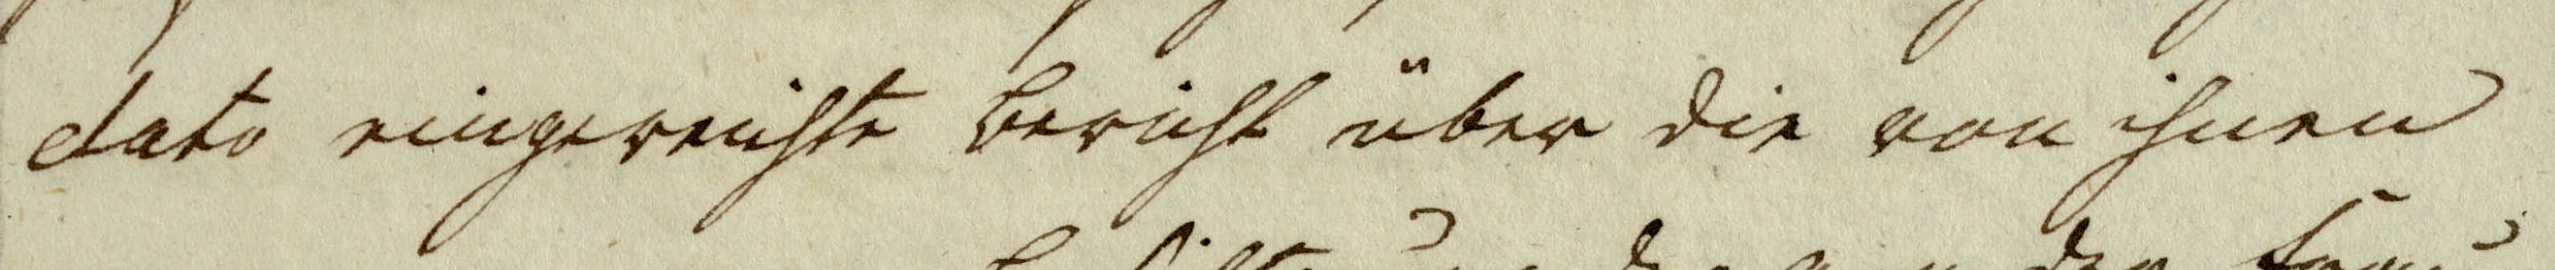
dato eingereichte Bericht über die von ihnen
